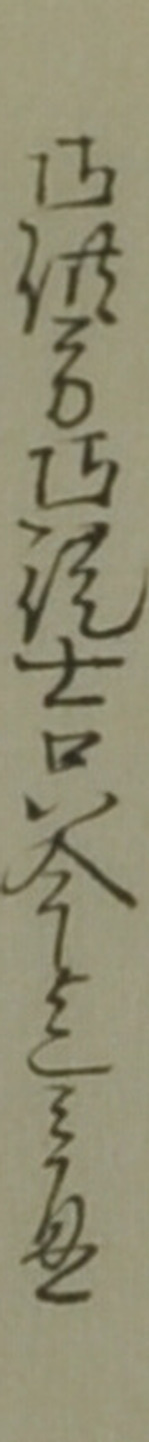御供方御徒士只今迄之通
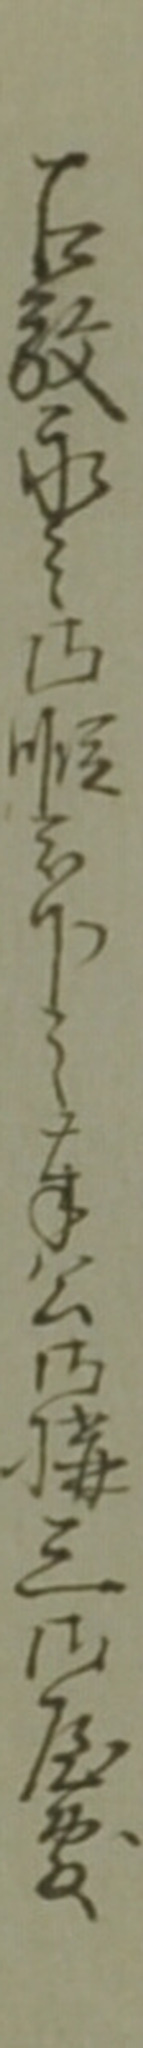召放永之御暇被下之奉公御構三御屋敷
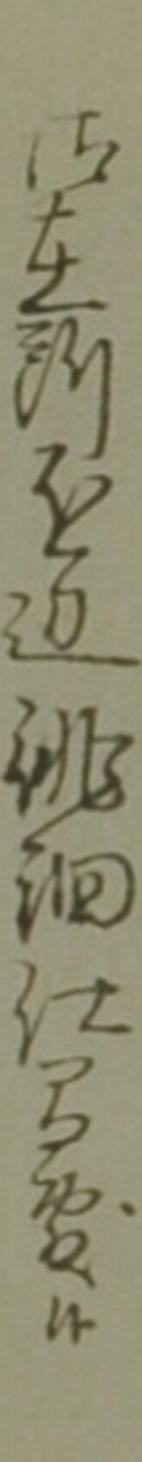御在所近辺徘徊仕間敷候

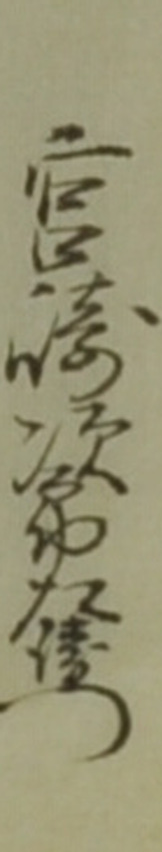宮崎次郎左衛門
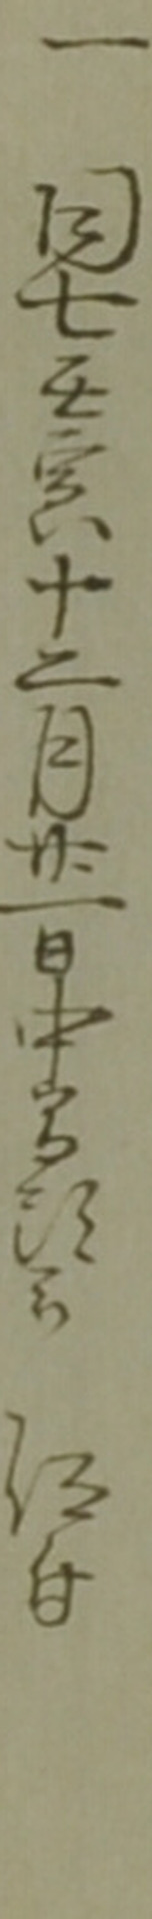一同七壬寅十二月廿一日中間頭被仰付
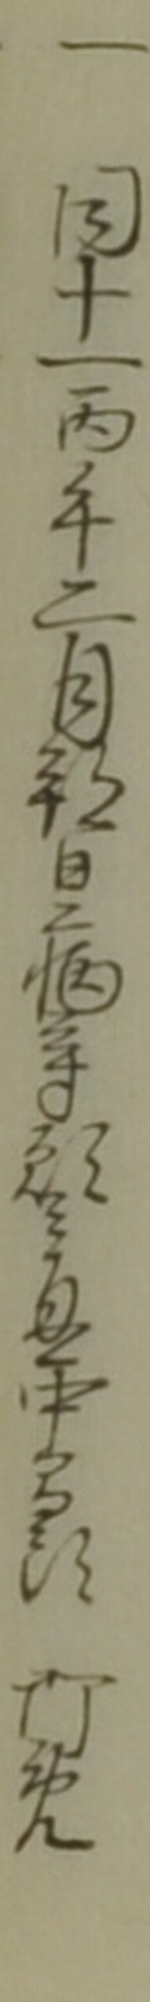一同年十一丙午二月朔日病気願之通中間頭御免
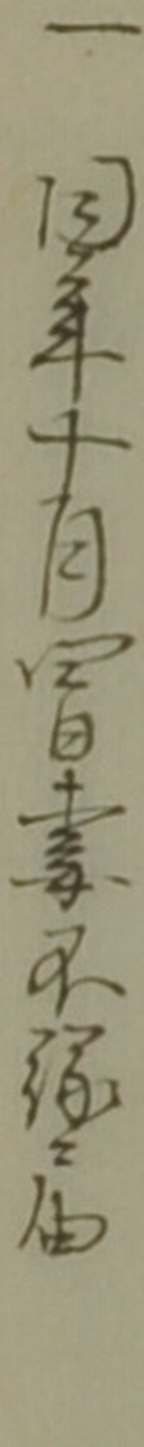一同年十月四日妻不縁届
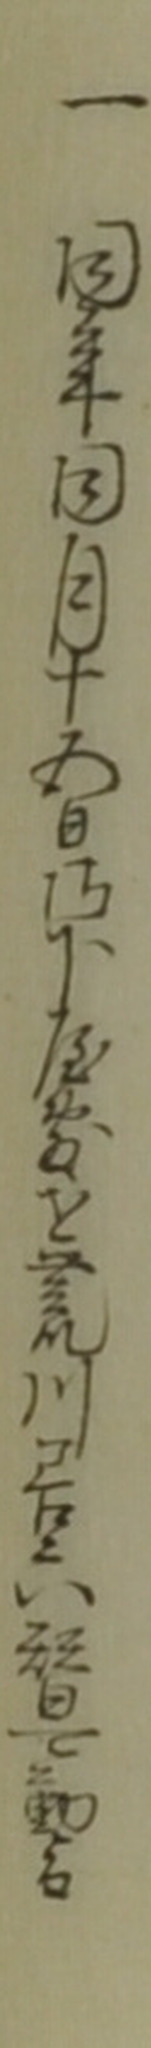一同年同月十五日御下屋敷を荒川善六替可勤旨
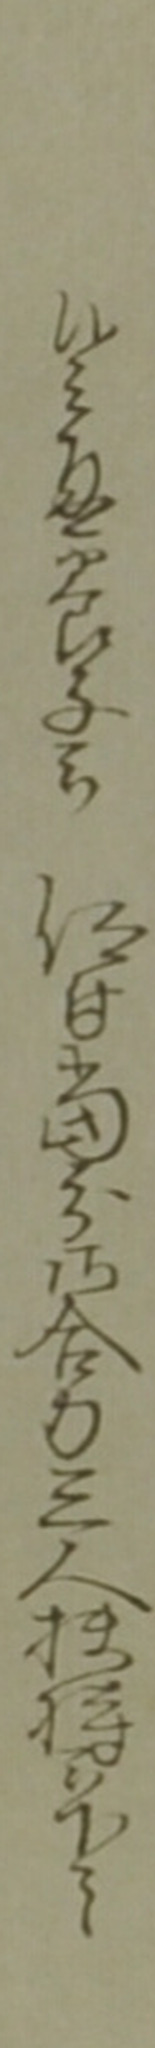候之通養子被仰付当分御合力三人扶持被下之
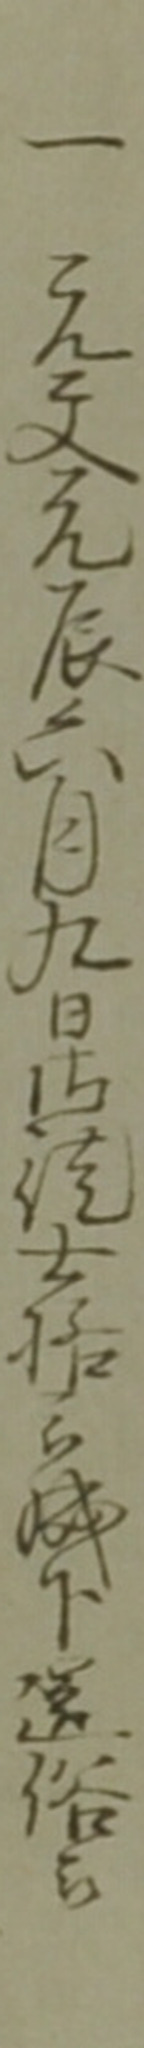一元文元辰六月九日御徒士格被成下還俗被
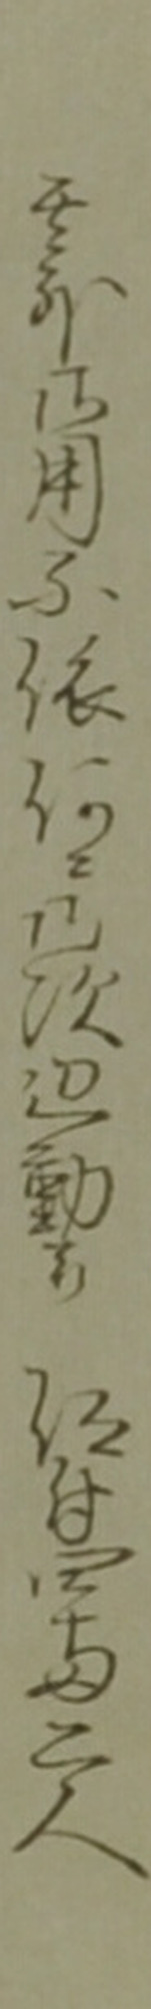其外御用不依何御次辺勤被仰付四両二人
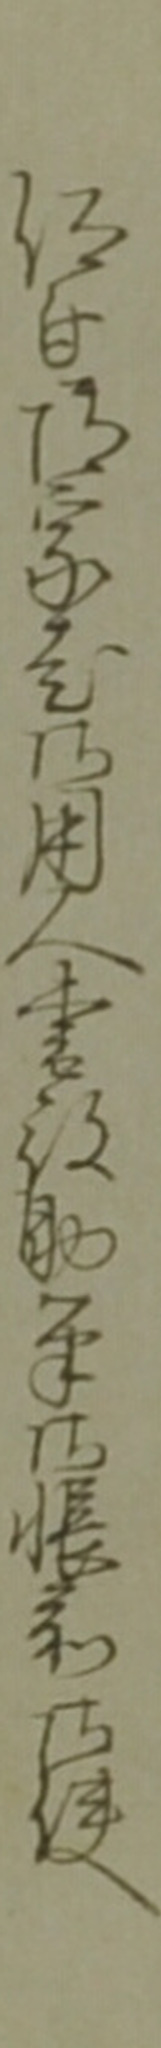仰付御家老御用人書役助筆御帳前御使
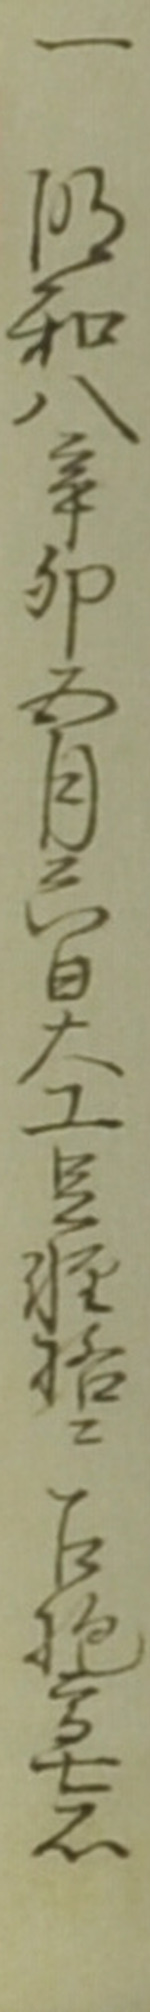一明和八辛卯五月六日大工足軽格召抱高七石

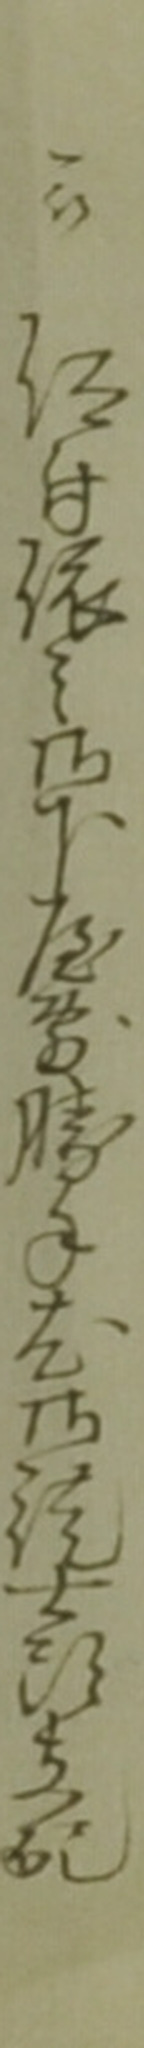被仰付依之御下屋敷勝手尤御徒士頭支配
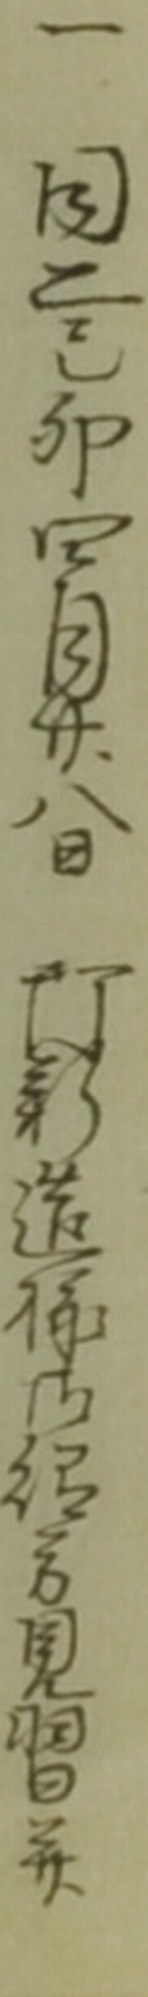一同二己卯四月廿八日御新造様御賄方見習并
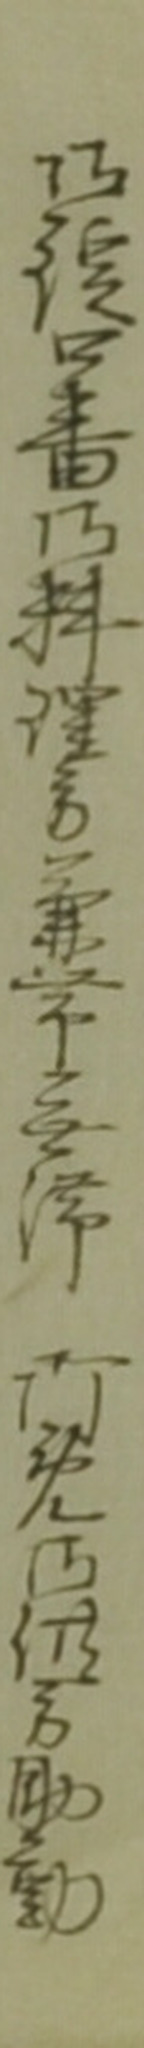御錠口番御料理方兼帯無滞御免御供方助勤
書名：無足廃家（弐）
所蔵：伊那市立高遠町図書館・合同会社AMANE
